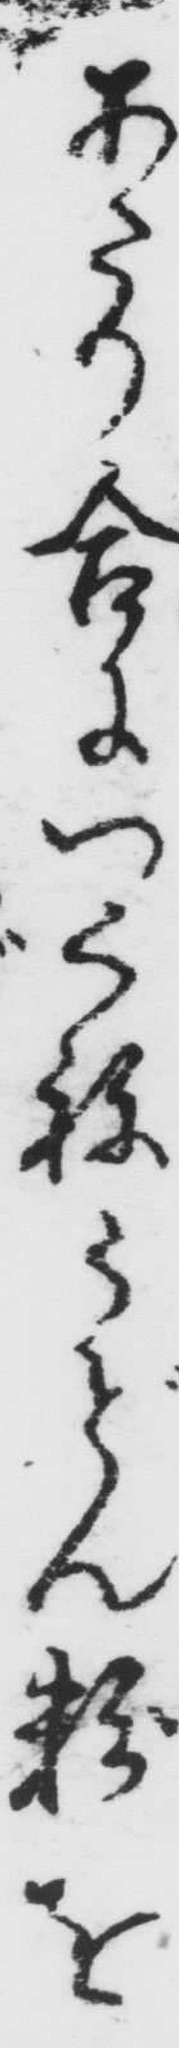あたり合につくねうどん粉を
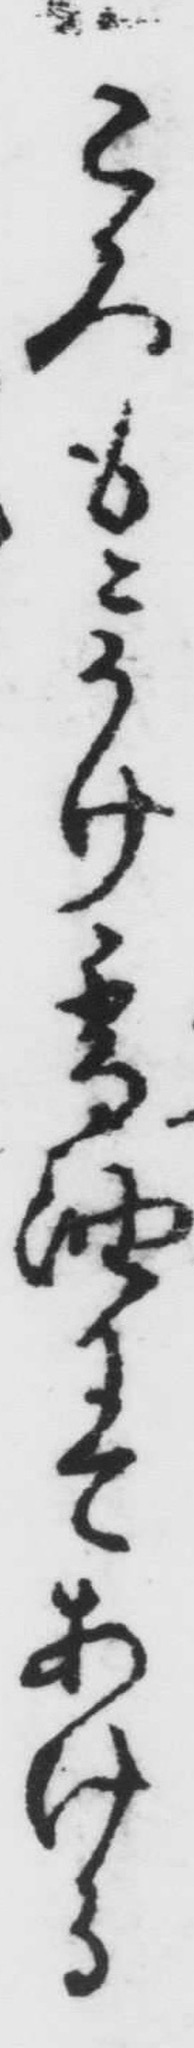ころもにかけ香油にてあける
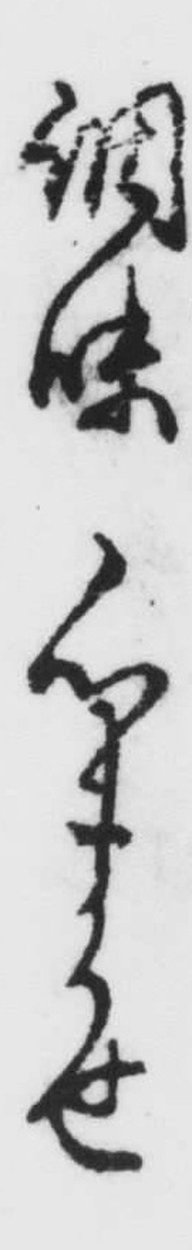調味心まかせ
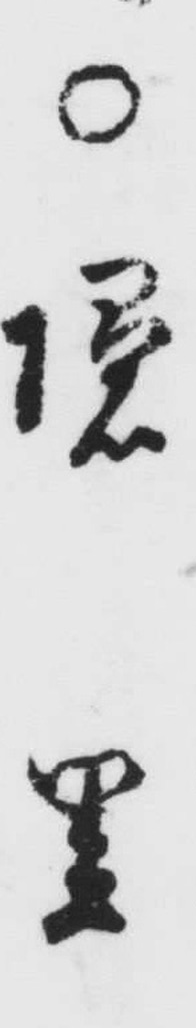○隠里
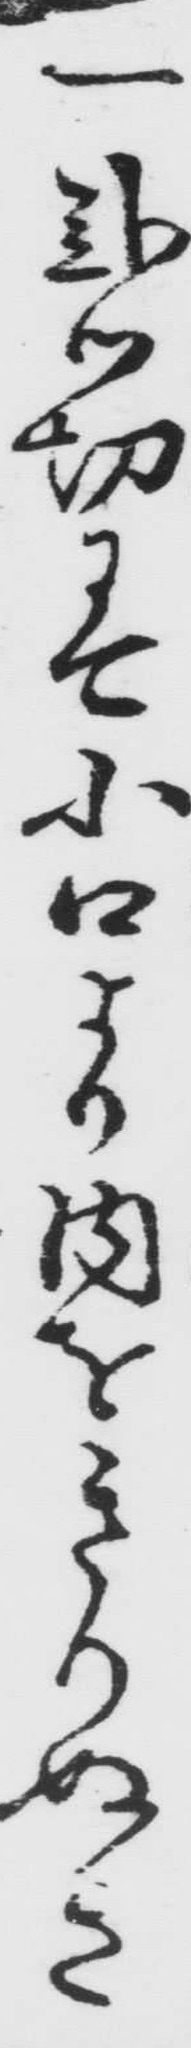一弐つ切にて小口より内をきりぬき
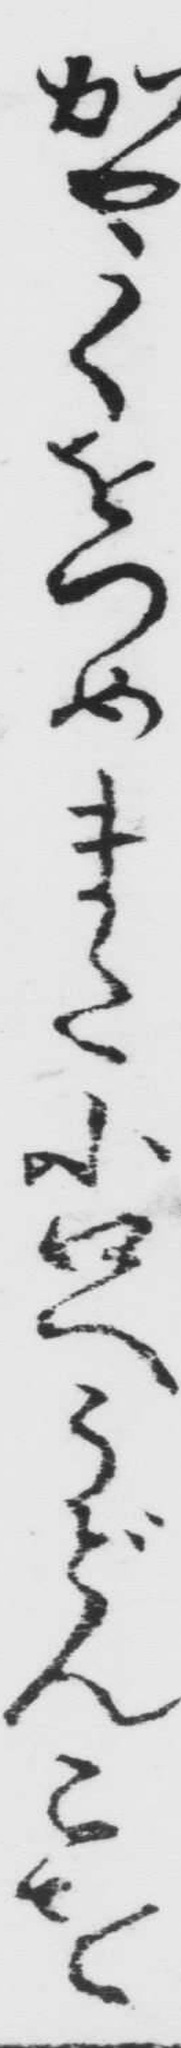加やくをつめまた小口へうどんこを
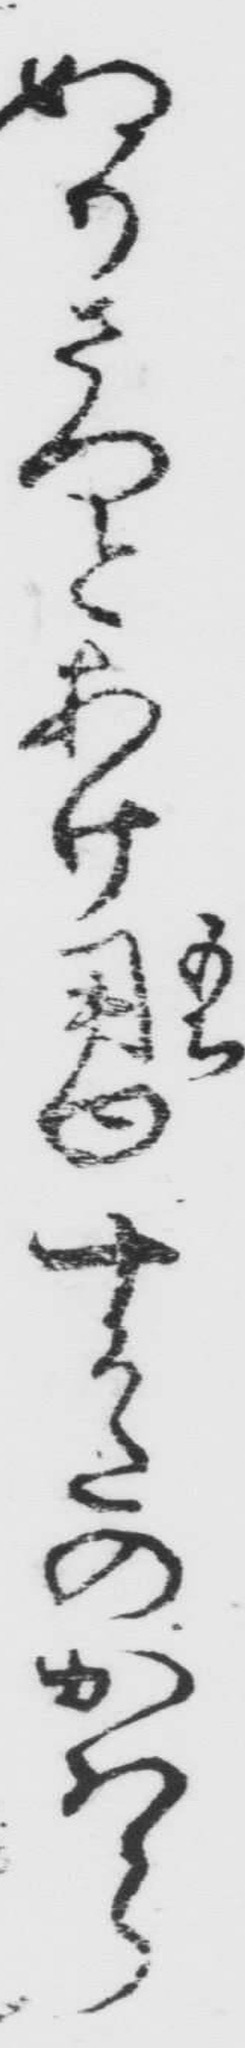ぬりさつとあけ用ゆすかたのかはら
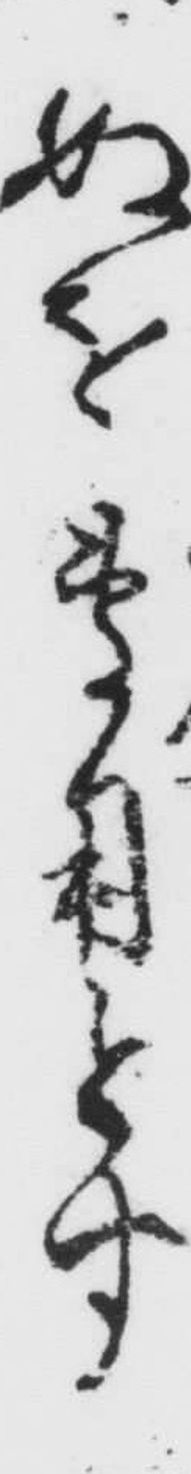ぬを専用とす
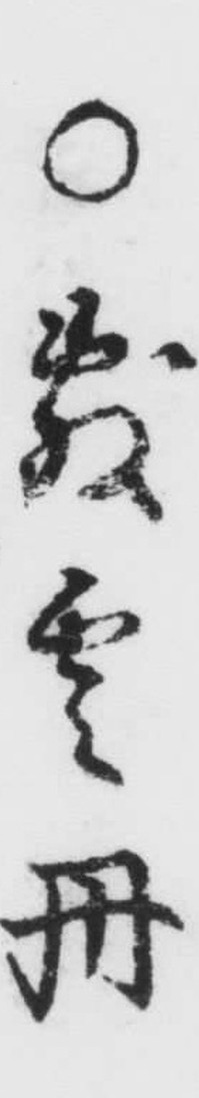○敷雲丹
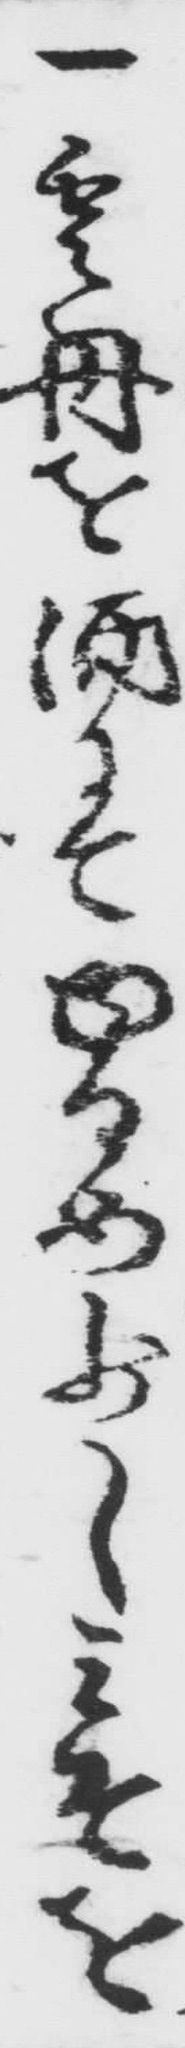一雲丹を酒にてゆるめ少しみそを
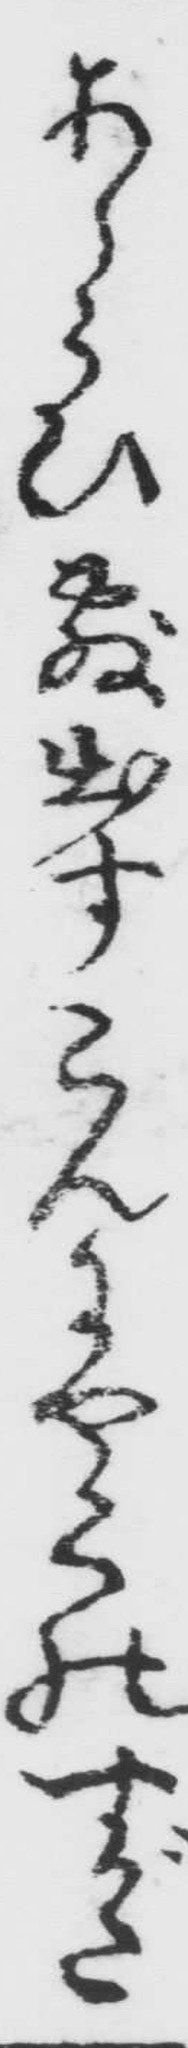あしらひ敷出すこんにやくのすがた

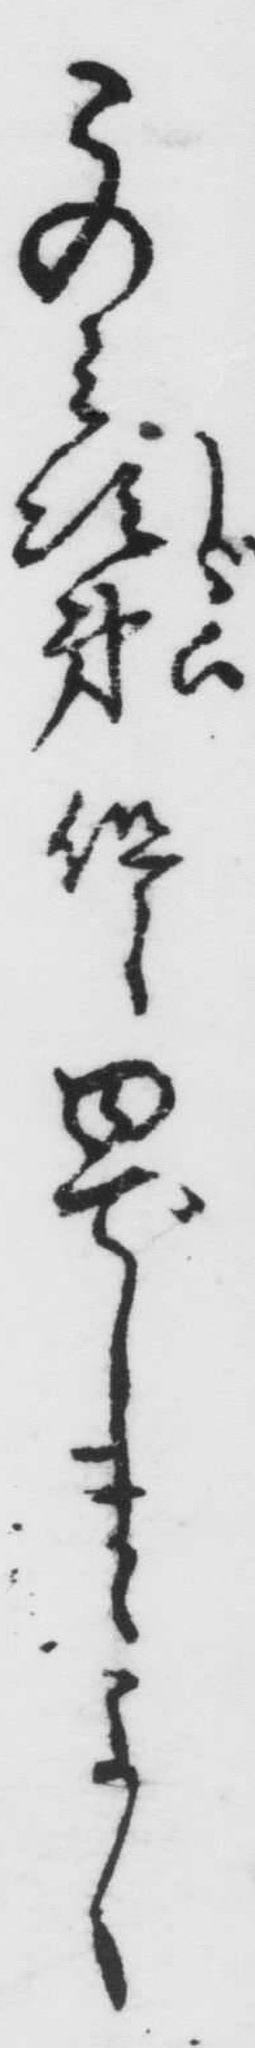このみ次第但しゆでしまゝよし
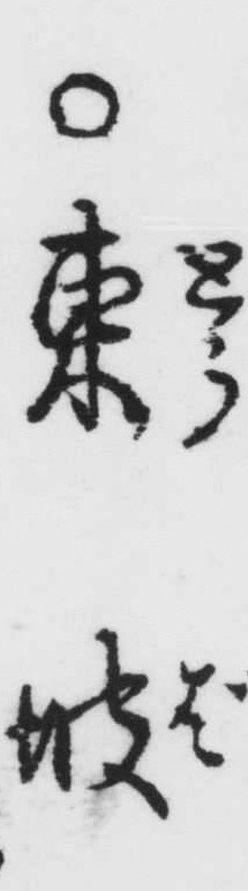○東波
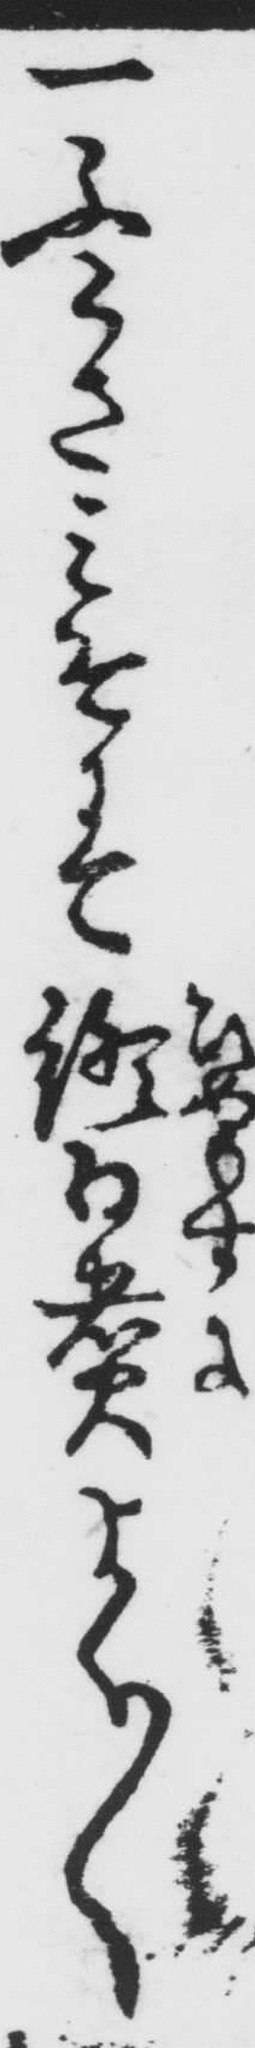一ふくさみそにて終日煮よく〳〵
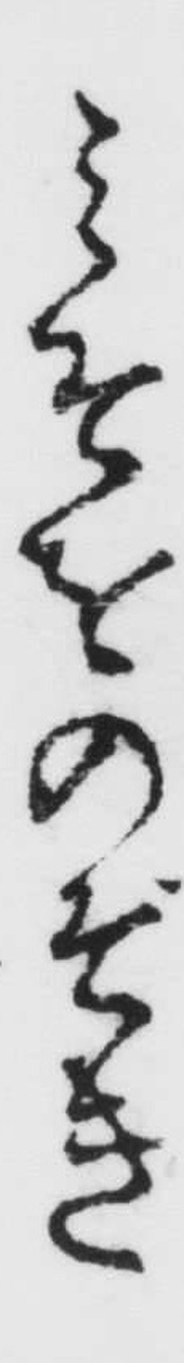みそをのぞき
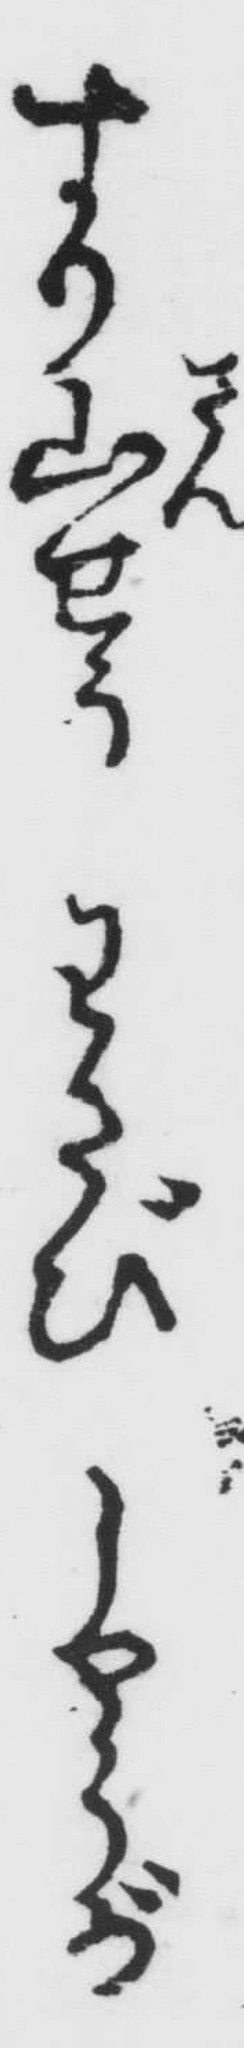すり山せうわさびしやうが
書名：蒟蒻百珍
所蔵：大阪府立大学学術情報センター 国文学研究資料館
